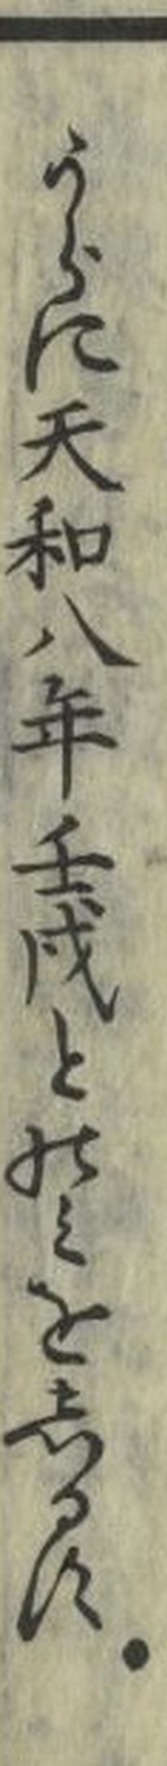うらに天和八年壬戌とのみをしるす・

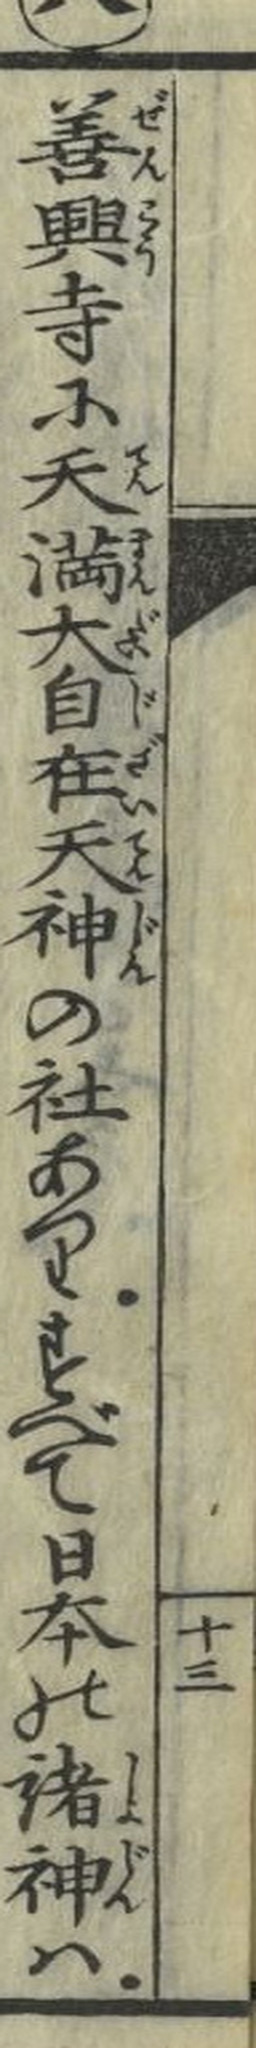善興寺に天満大自在天神の社あり・すべて日本の諸神は
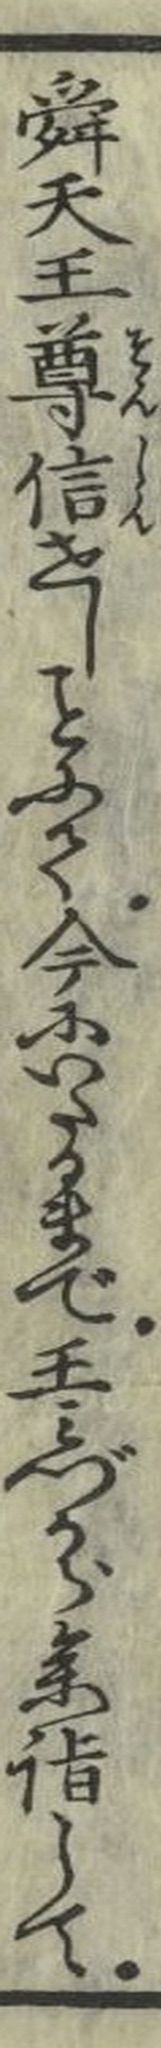舜天王尊信をしことにて・今にいたるまで・王みづから参詣して・
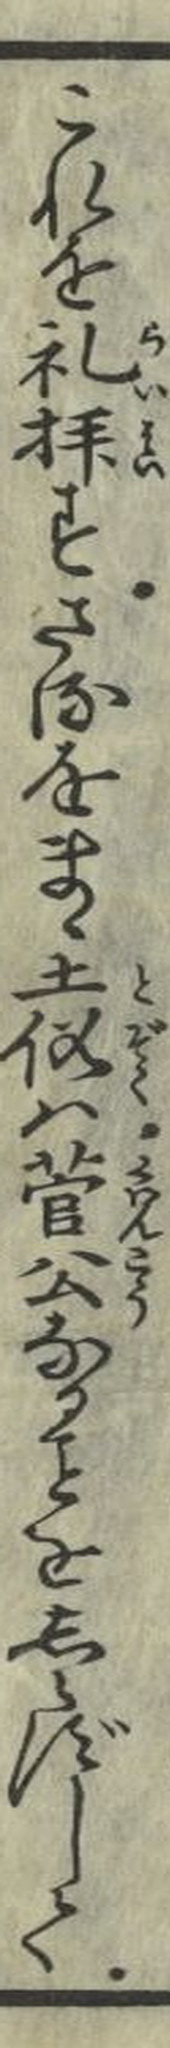これを礼拝す・さるをまゝ土俗は菅公なることをしらずして・
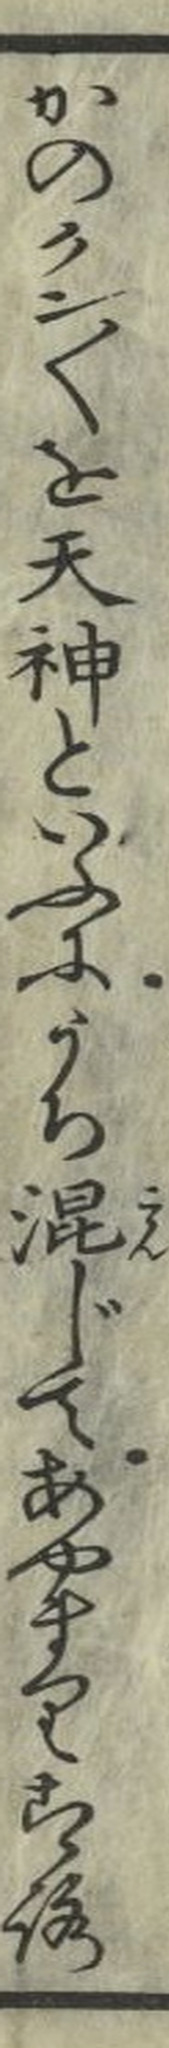かのかン〳〵を天神といふに・混じて・あやまりこゝろ
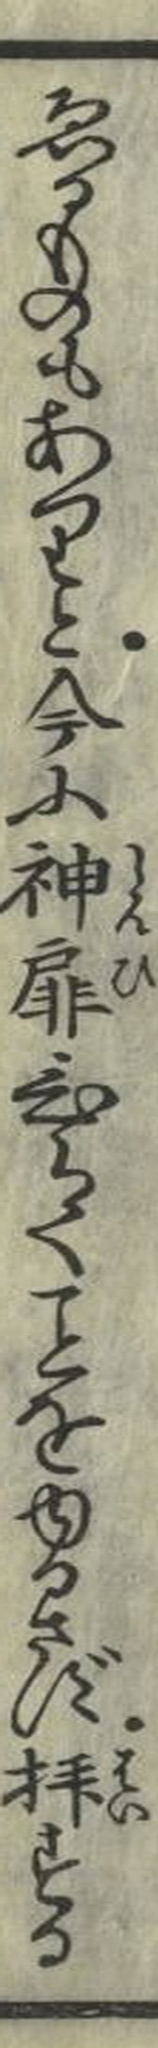ゑるものもありと・今に神扉ひらくことをゆるさず・拝する
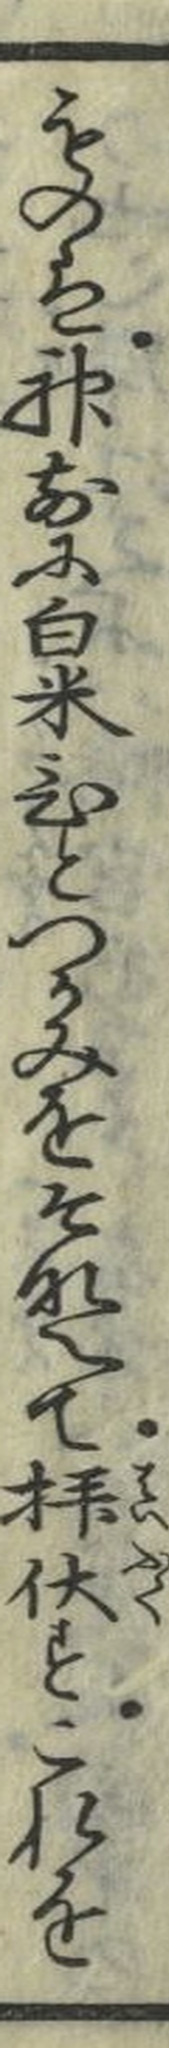ものは・神前に白米ひとつかみをそなへて・拝伏す・これを
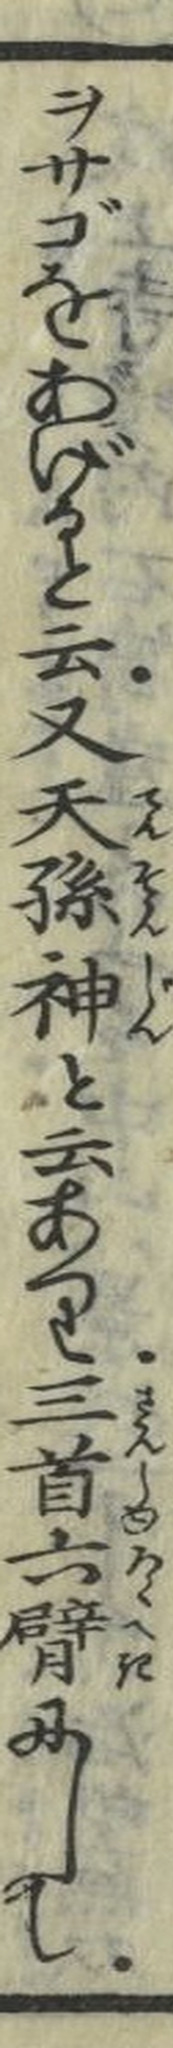ヲサゴをあげると云・又天孫神と云あり・三首六臂にして・
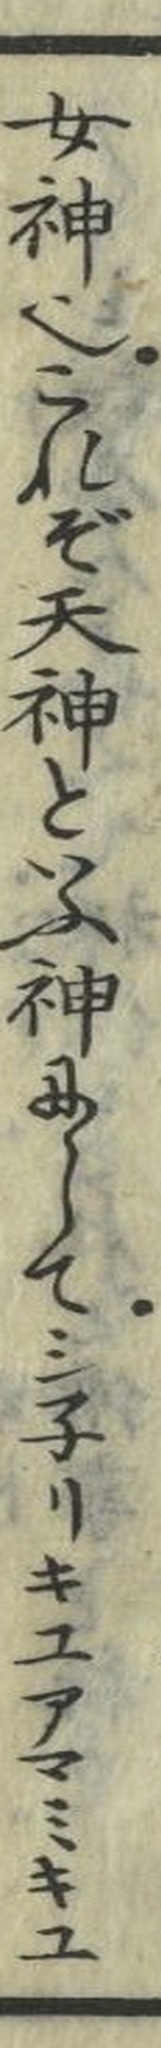女神也・これぞ天神といふ神にして・シネリキユアマミキユ
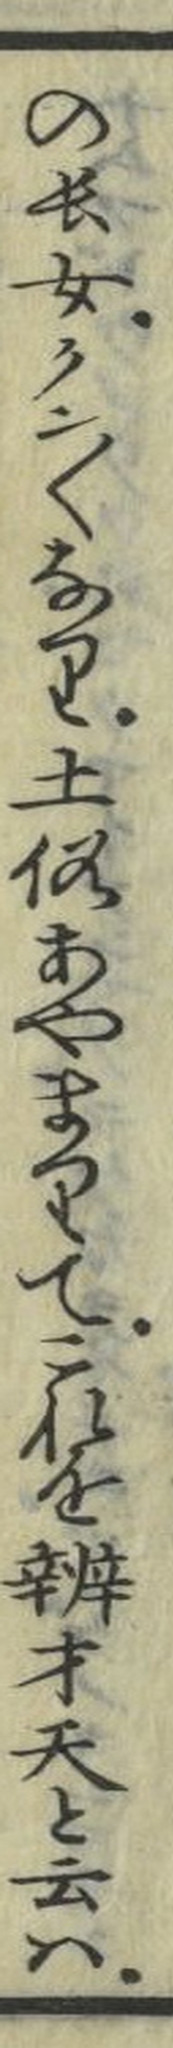の長女・かン〳〵なり・土俗あやまりて・これを辨才天と云は・
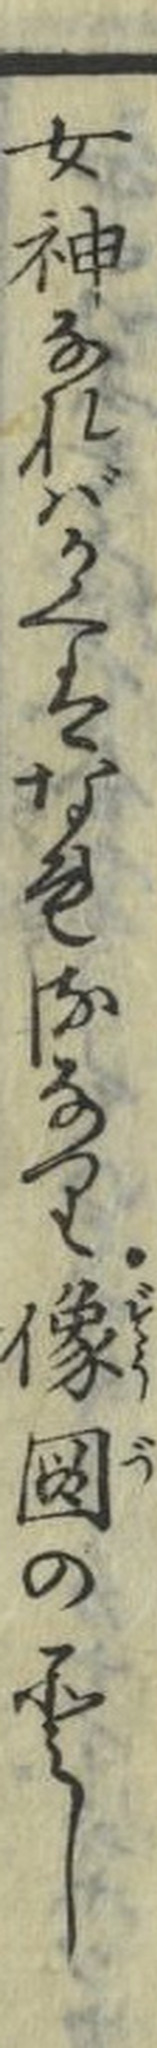女神なればかくはなれるなり・像図のことし
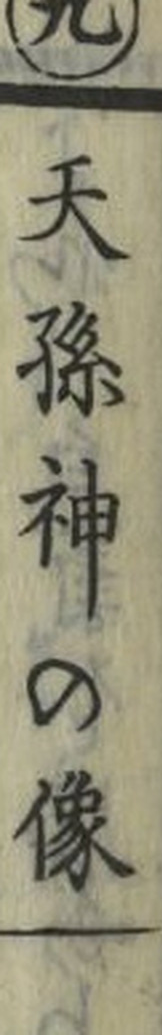天孫神の像

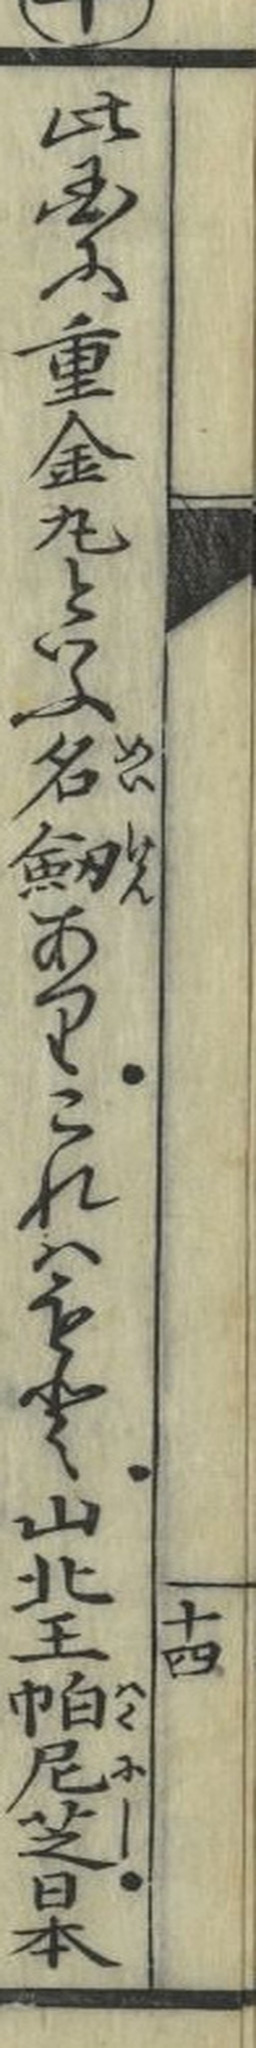此国に重金丸といふ名劔あり・これはもと・山北王帕尼芝日本
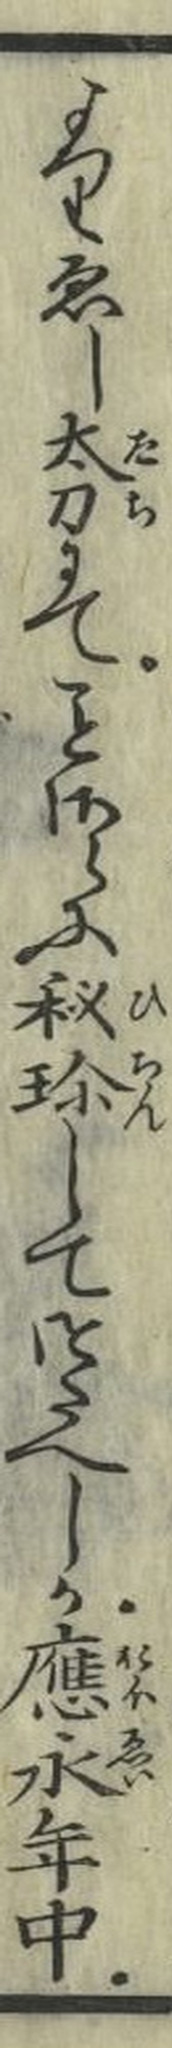よりゑし太刀にて・ことさらに秘珍してつたへしか・應永年中
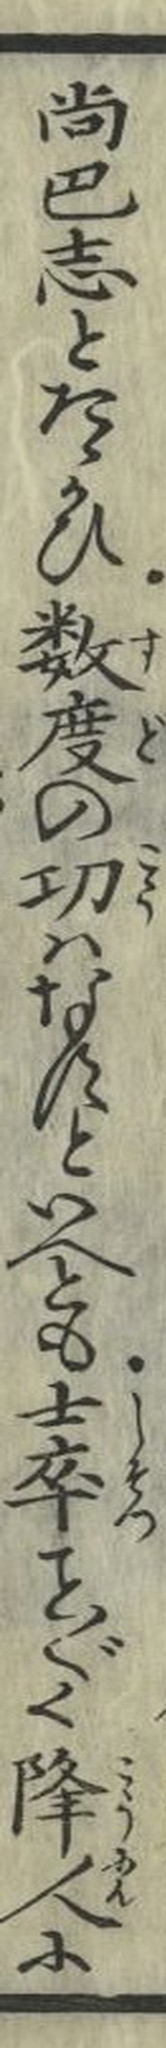尚巴志とたゝかひ・数度の功はなすといへとも・士卒こと〴〵く降人に
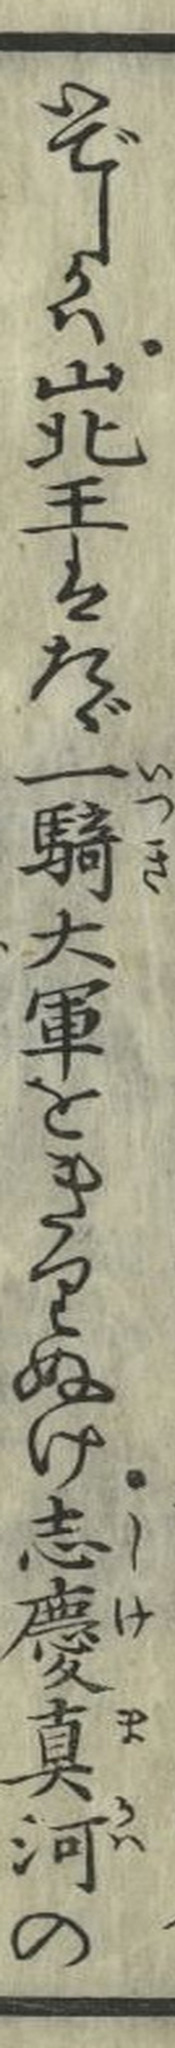いでしかは・山北王はたゞ一騎大軍をきりぬけ・志慶真河の
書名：琉球秊代記 附雑話 全
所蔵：University of the Ryukyus Library
